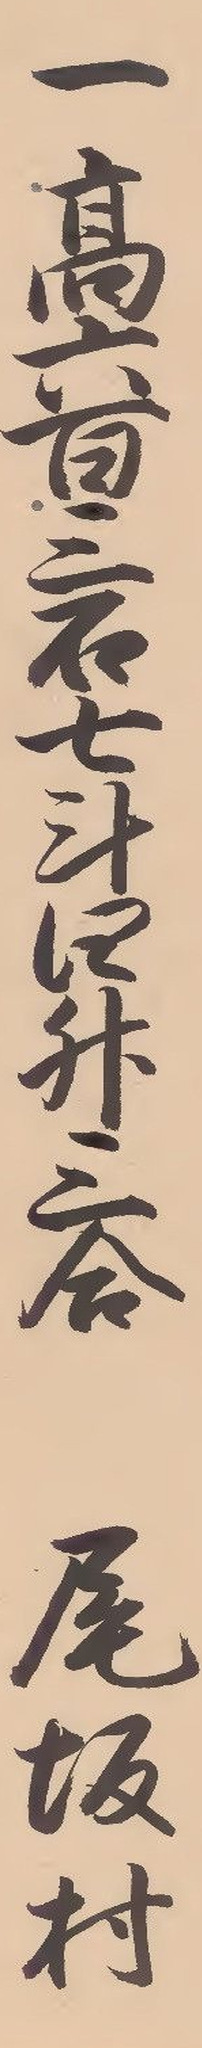一高六百三石七斗四升三合尾坂村

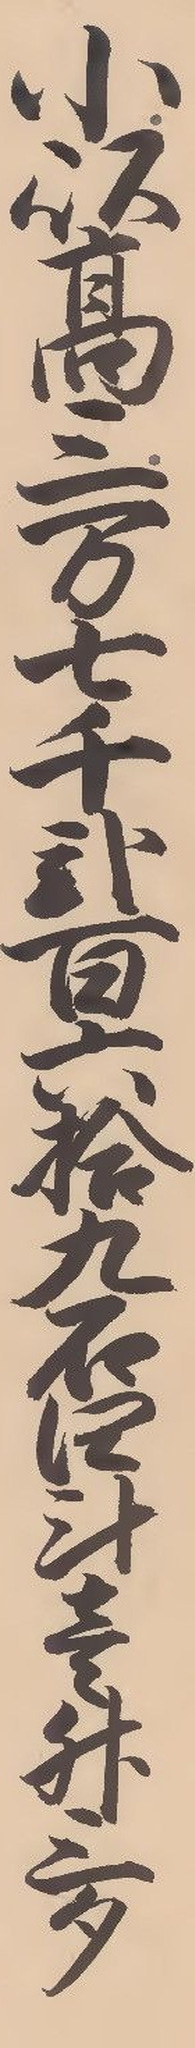小以高三万七千弐百六拾九石四斗壱升三勺
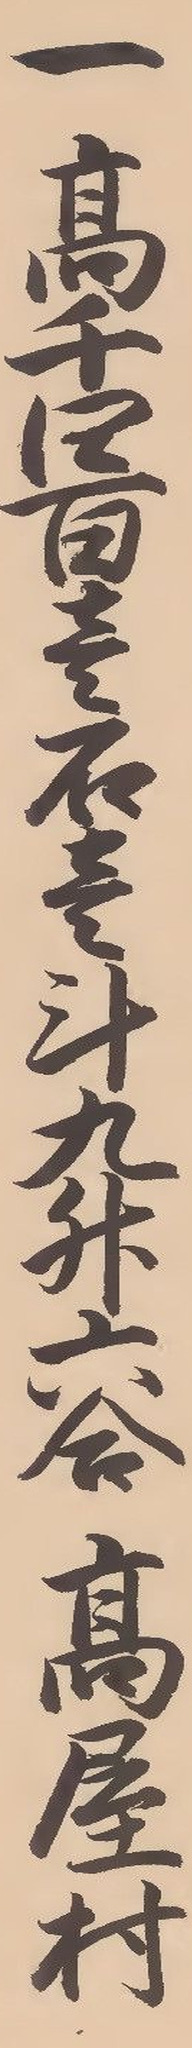一高千四百壱石壱斗九升六合高屋村
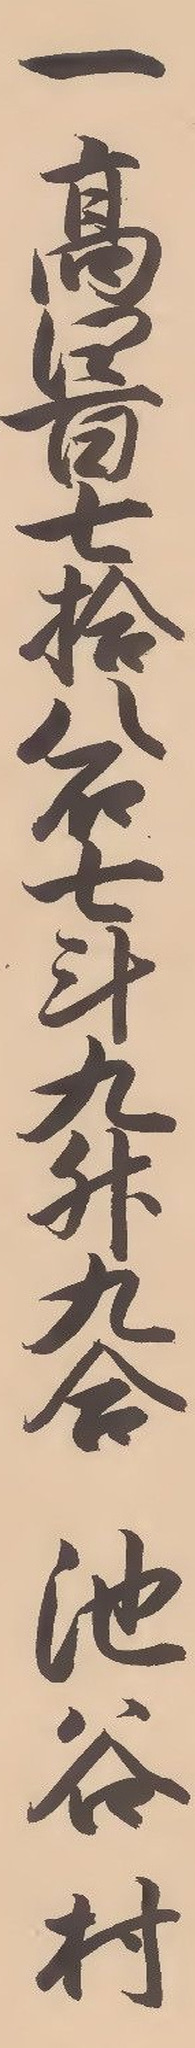一高四百七拾八石七斗九升九合池谷村
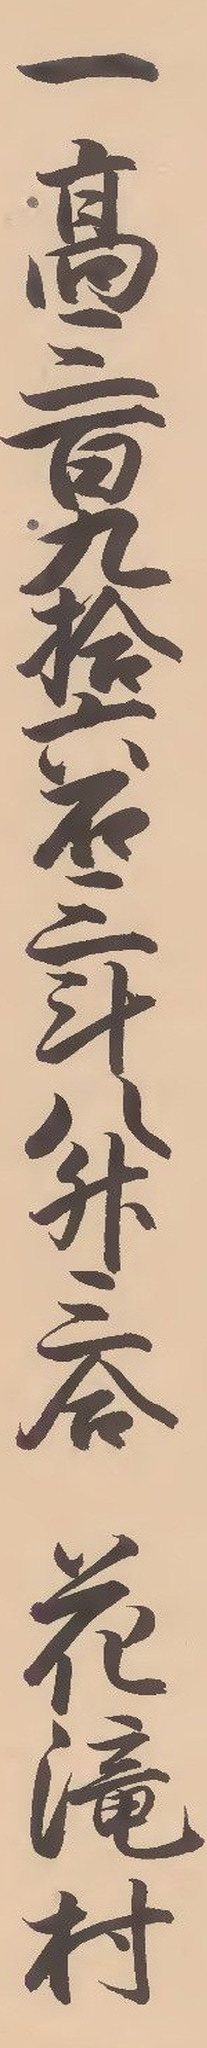一高三百九拾六石三斗八升三合花滝村

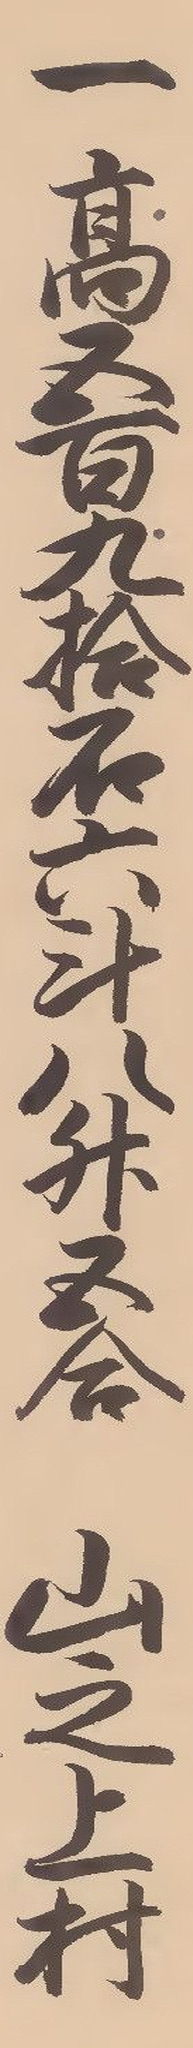一高五百九拾石六斗八升五合山之上村
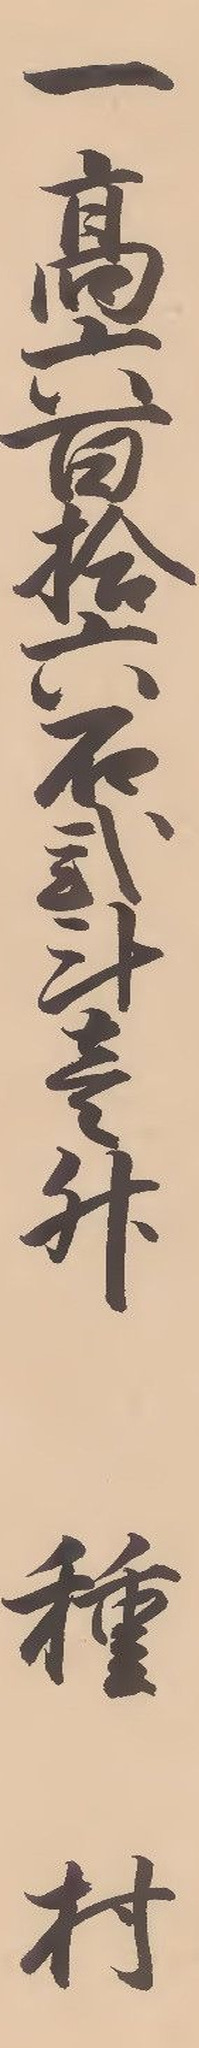一高六百拾六石弐斗壱升種村
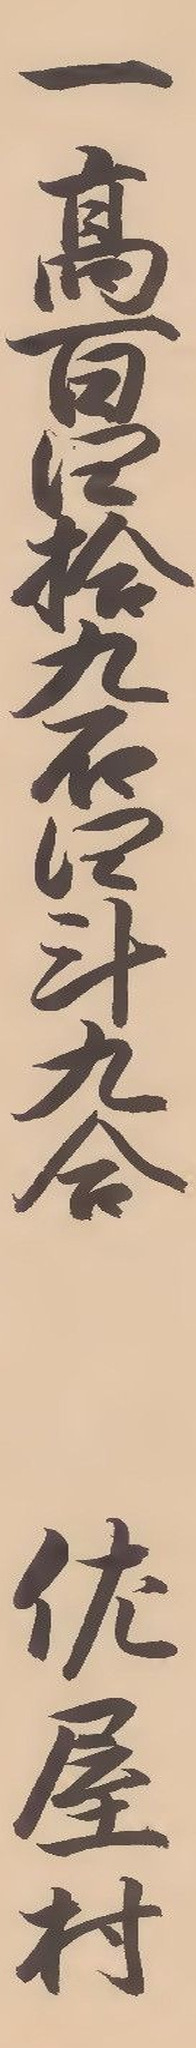一高百四拾九石四斗九合佐屋村
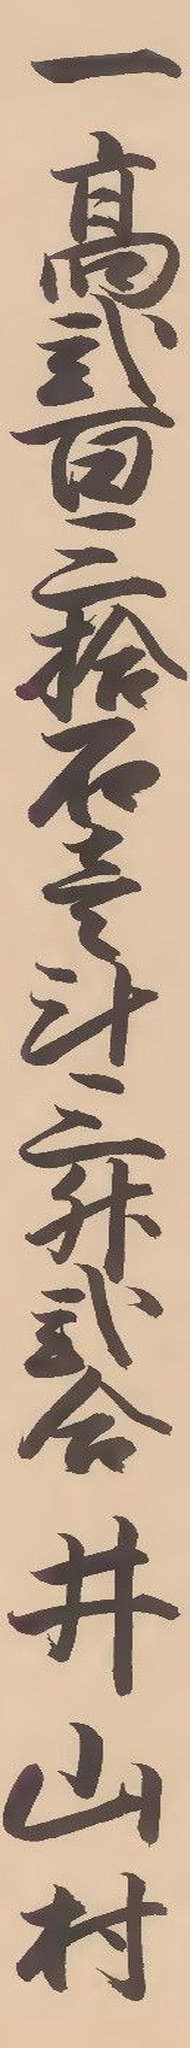一高弐百三拾石壱斗三升弐合井山村
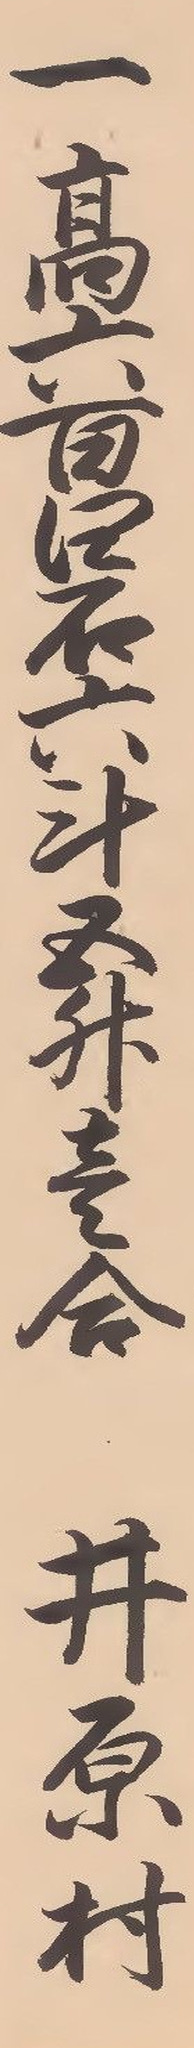一高六百四石六斗五升壱合井原村
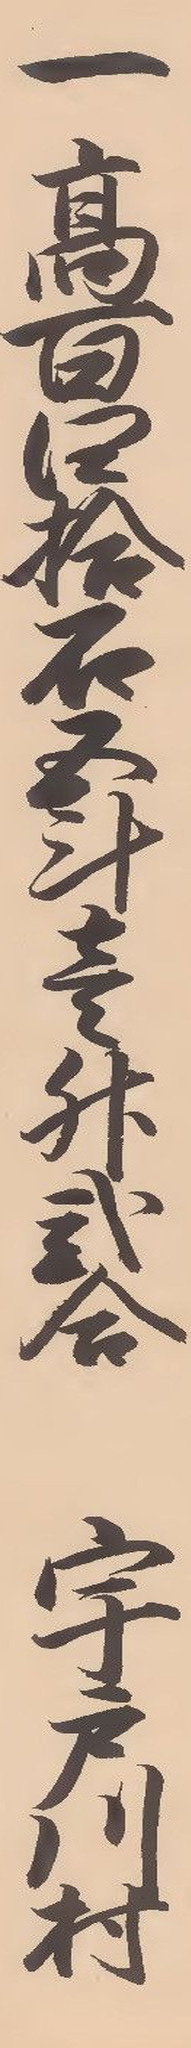一高百四拾石五斗壱升弐合宇戸川村
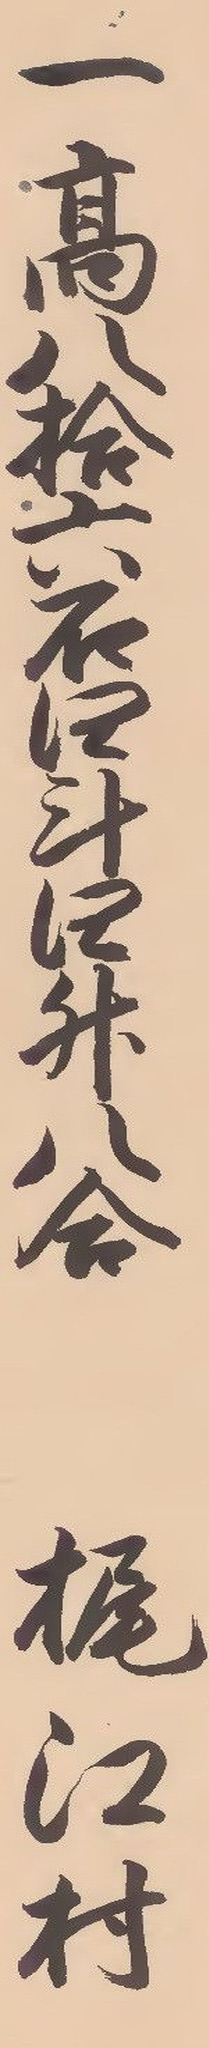一高八拾六石四斗四升八合梶江村

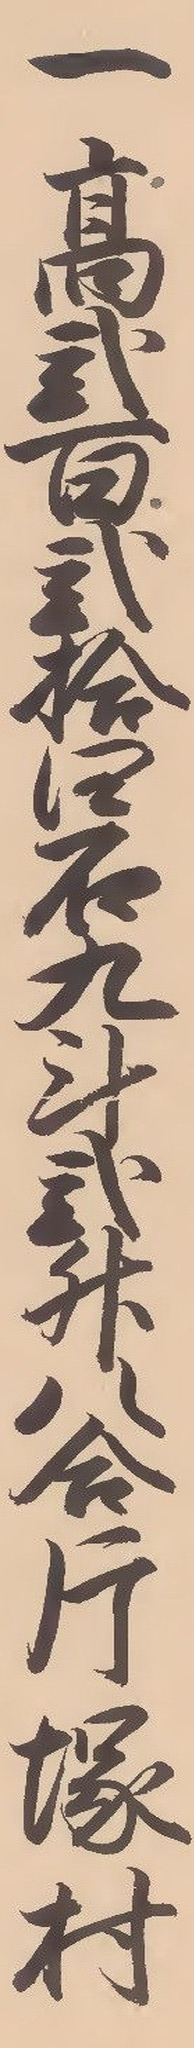一高弐百弐拾四石九斗弐升八合片塚村
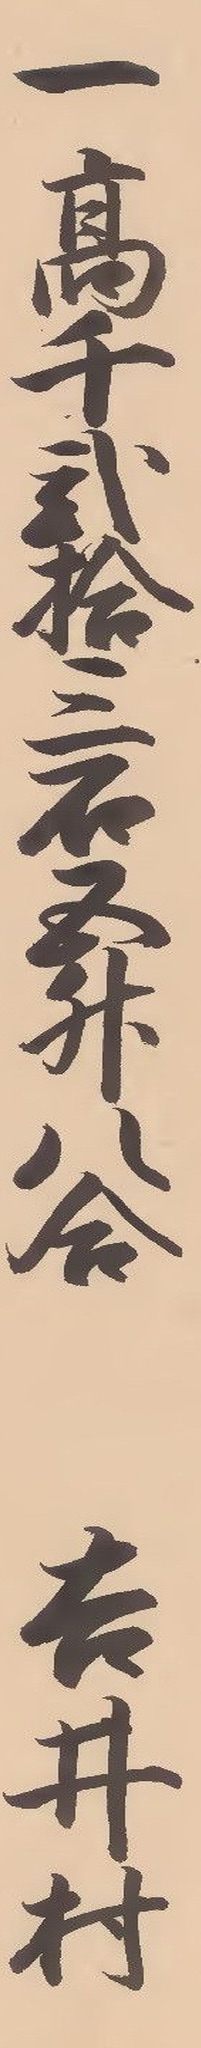一高千弐拾三石五升八合吉井村
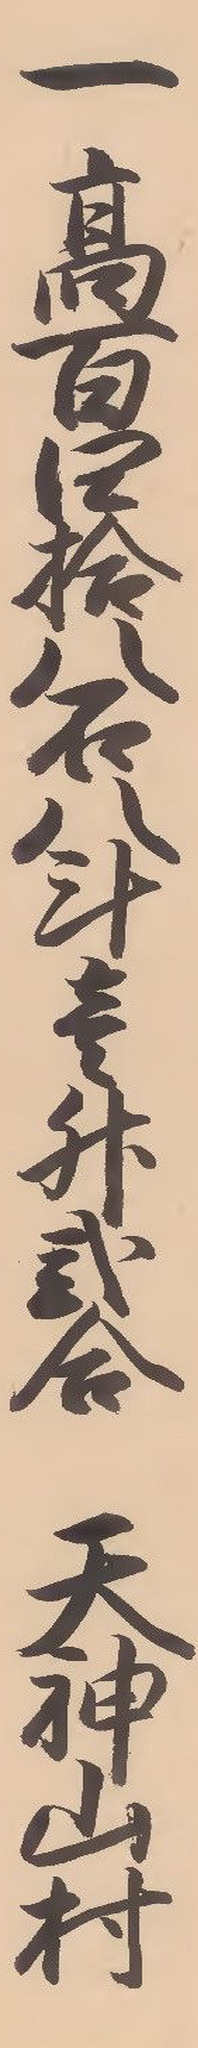一高百四拾八石八斗壱升弐合天神山村
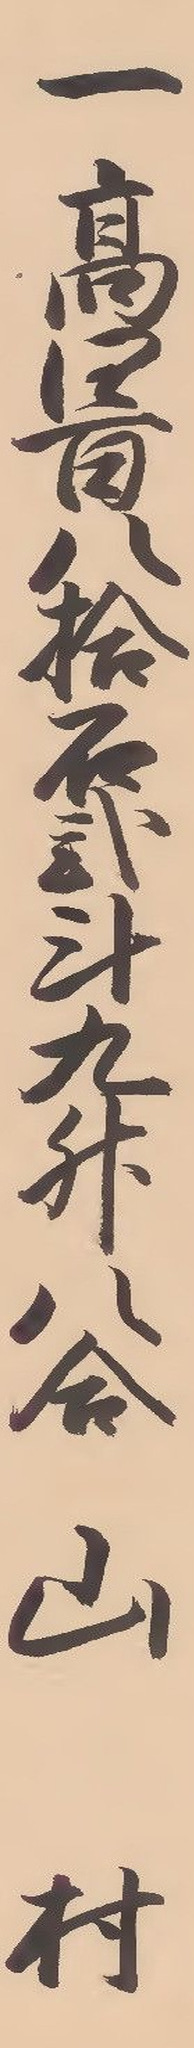一高四百八拾石弐斗九升八合山村
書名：備中国郷帳
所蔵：国立公文書館 National Archives of Japan
